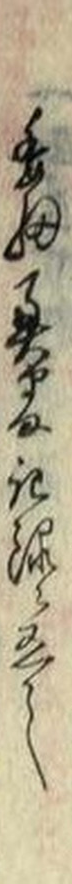委細奥番記録ニ有之
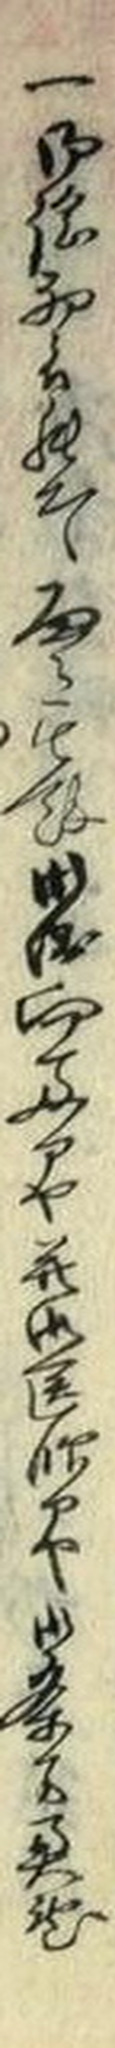一御謡初ニ付罷出候面々其余御側向両部や幷御医師部や御茶方奥台
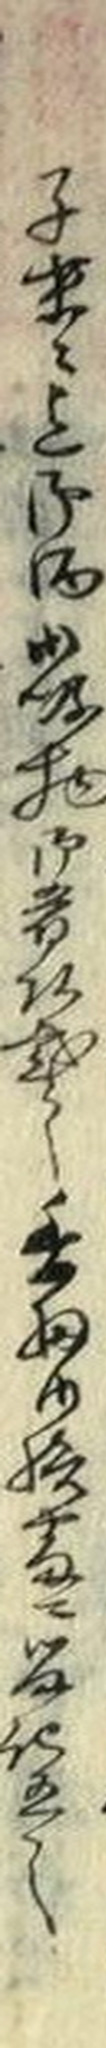子末々迄御酒御吸物御肴頂戴之委細御膳番ニ留記有之
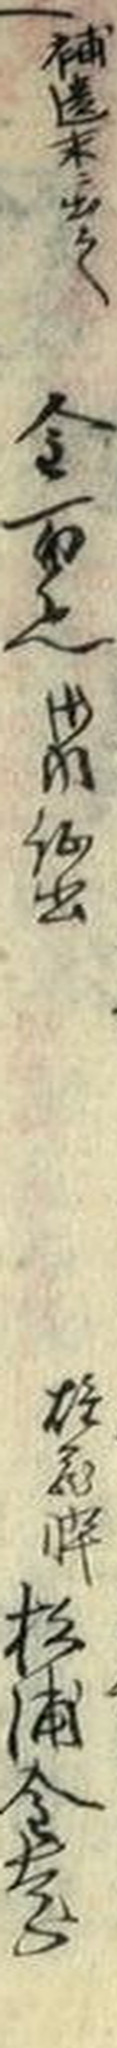金百疋御内証出雄蔵忰杉浦金太郎
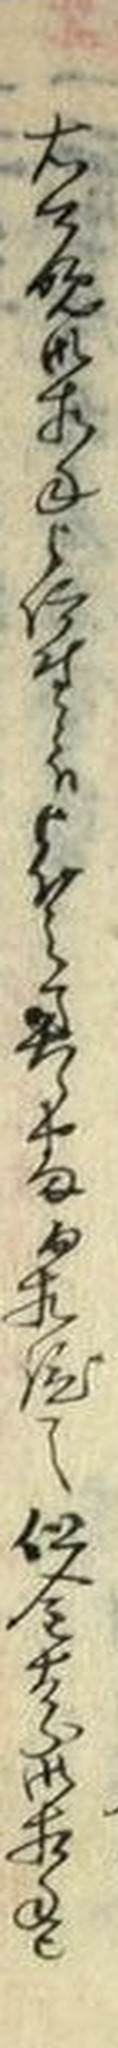右今晩御相手被仰付候ニ付被下之奥之番ゟ相渡之但金太郎御相手被
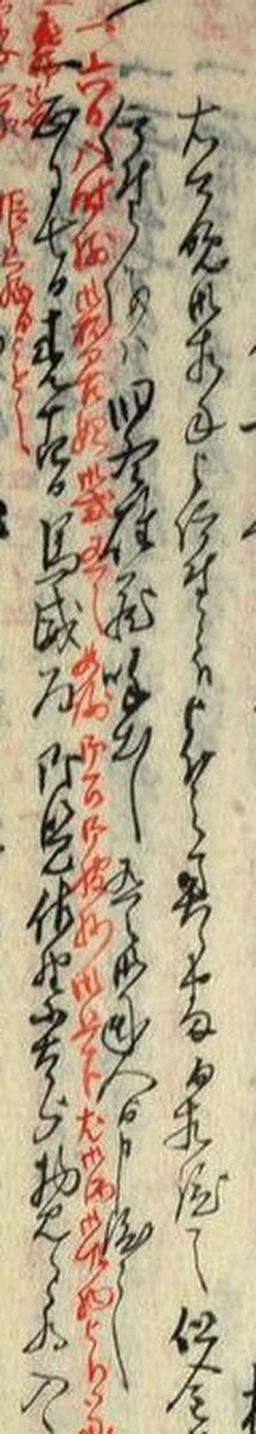仰付候儀ハ旧冬雄蔵呼出し有之御用人ゟ申渡之
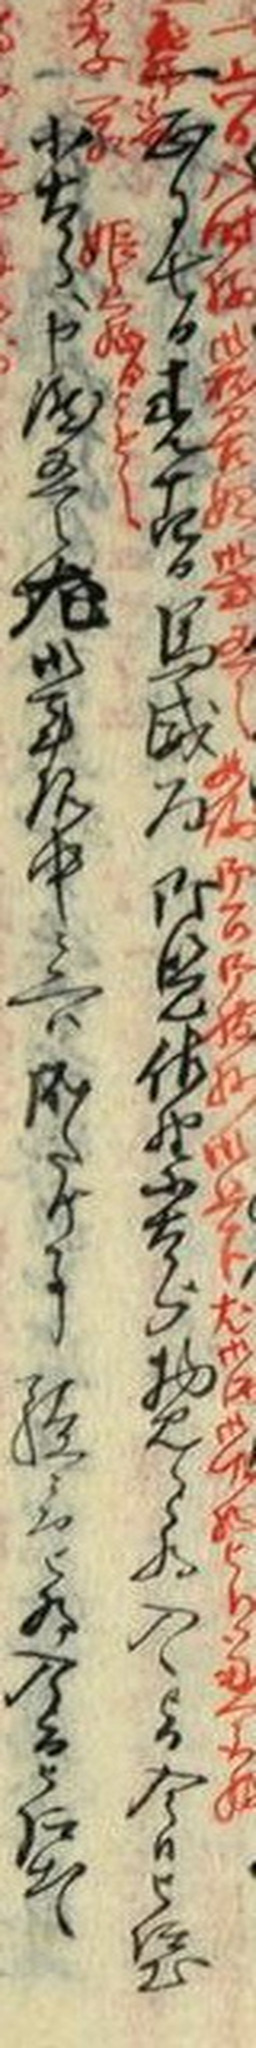小太郎へ申渡有之尤御年限中ニ候へハ成たけ事穏ニ而被為入候旨被仰出候

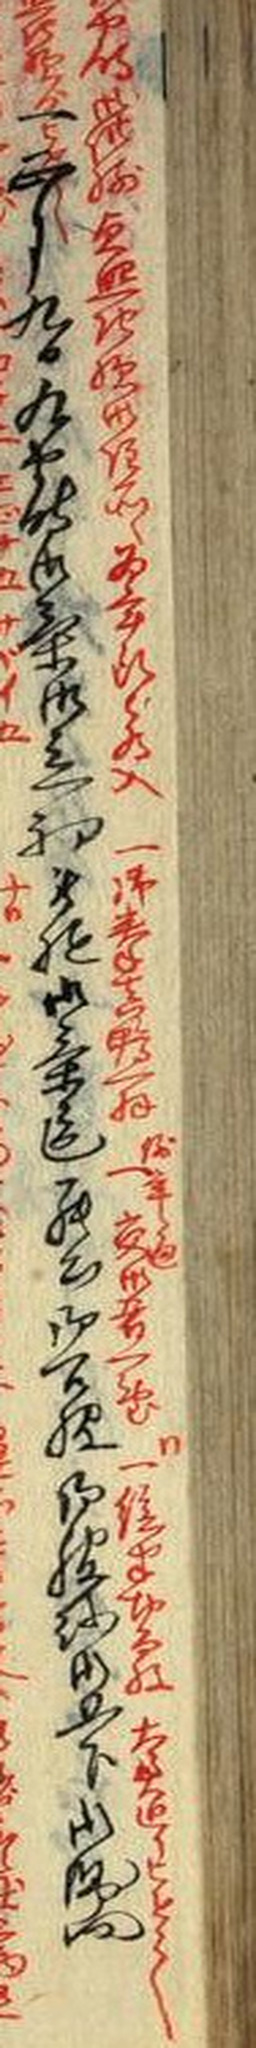一正月九日九半時御茶御立初被遊御茶道罷出御召服御服紗御上下御側向
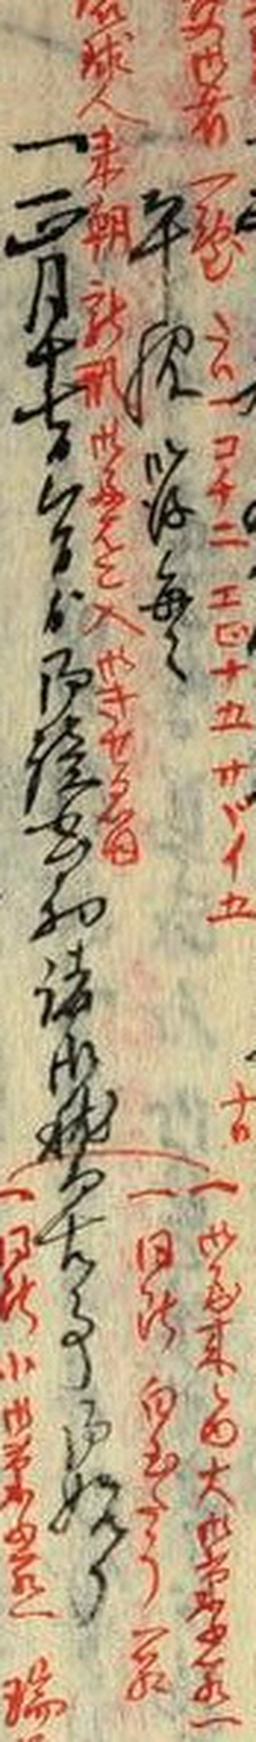一正月十七日今日ゟ御読書初諸御稽古事御始り
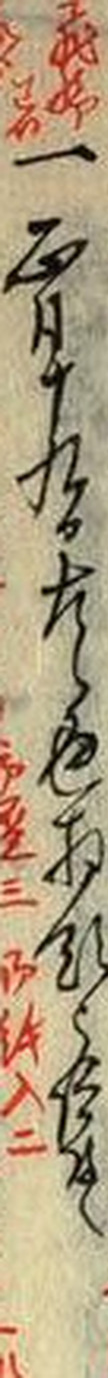一正月十九日左之通拝領被仰付候
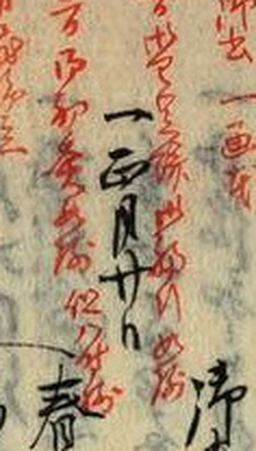一正月廿日
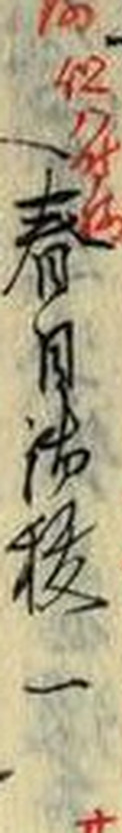春日御祓一
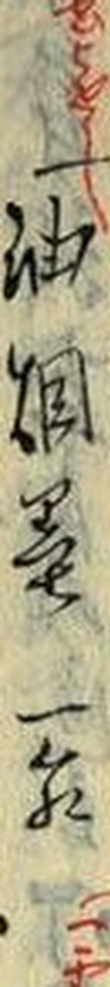油煙墨一箱
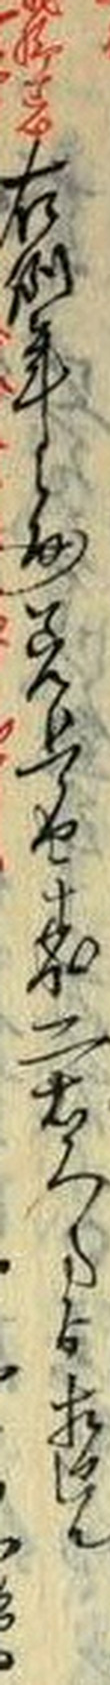右例年之通差上候由森仁右衛門方ゟ相廻ル
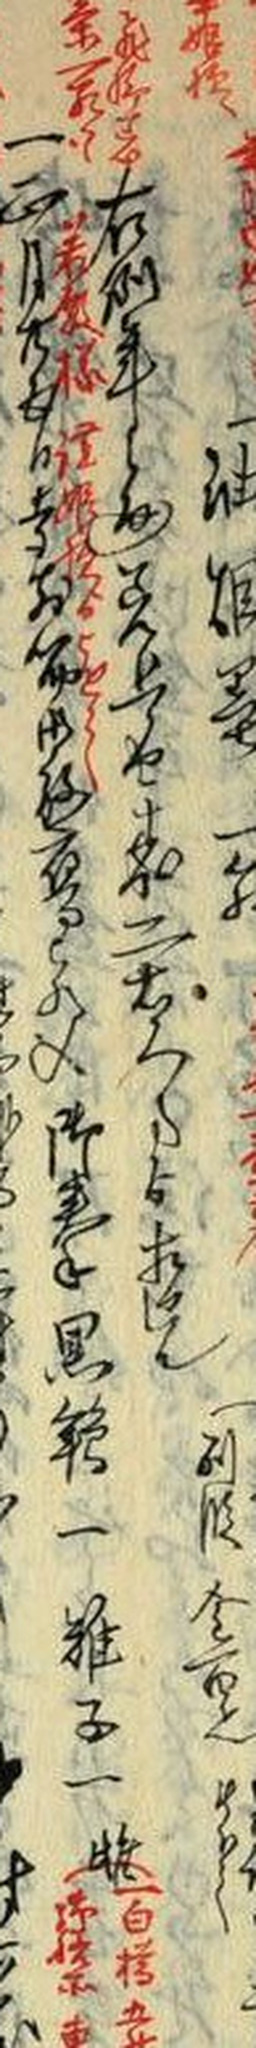一正月廿五日寺前筋御放鷹被為入御拳黒鵇一雉子一雌
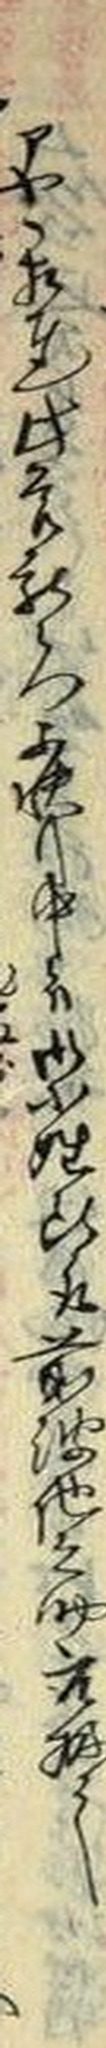部やへ相達此節新右衛門不快引中ニ付御小姓頭取前波他之助取扱之
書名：少傅日録抄（斉承付側向頭取日記、在国）
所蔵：福井県文書館 Fukui Prefectural Archives
